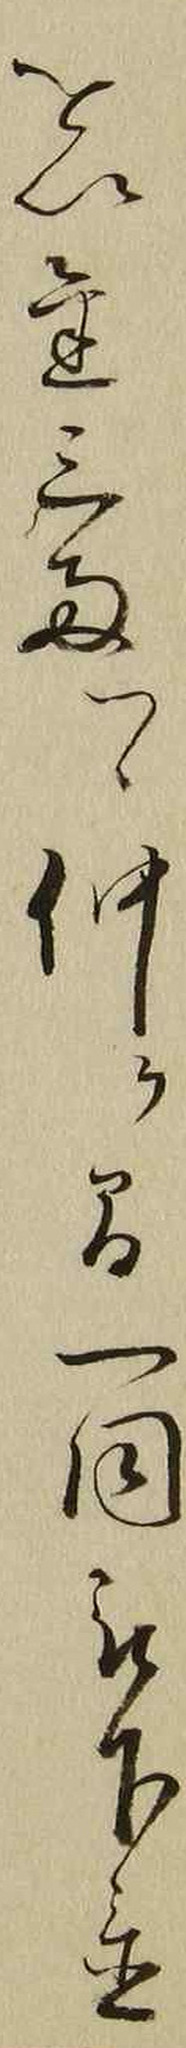を以金三両ツヽ仲ケ間一同被下置
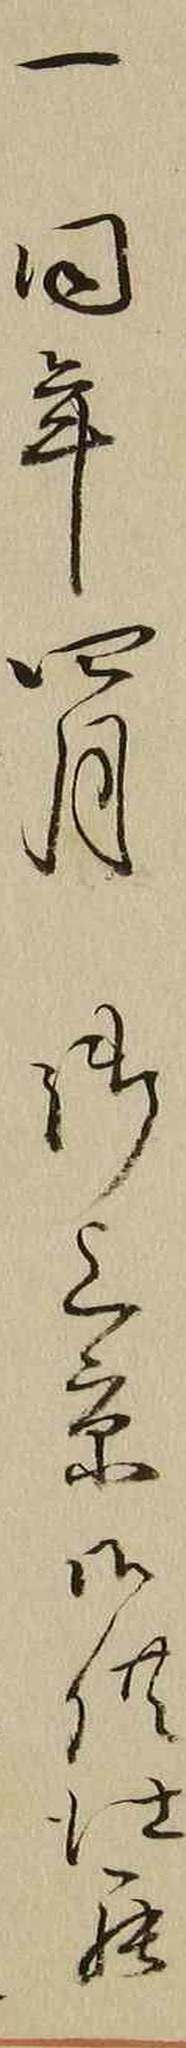一同年四月御上京御供仕罷
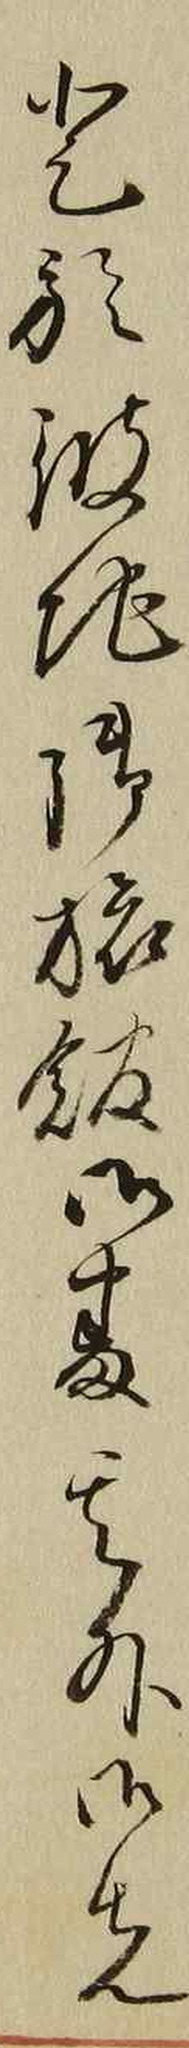登於彼此御旅飯御番其外御先
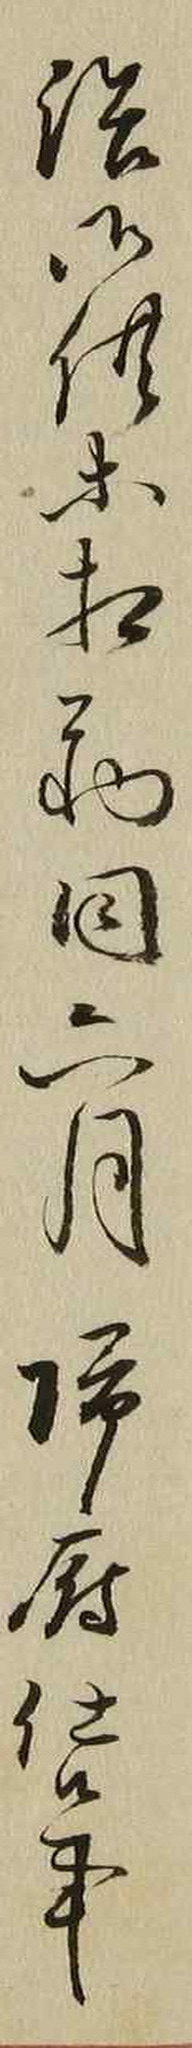詰御供等相勤同六月帰府仕候事
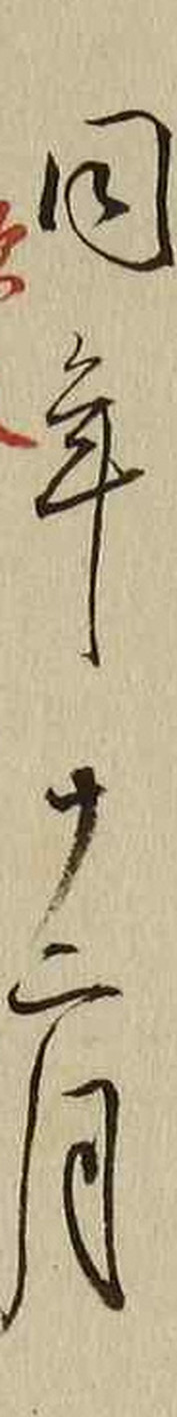同年十二月
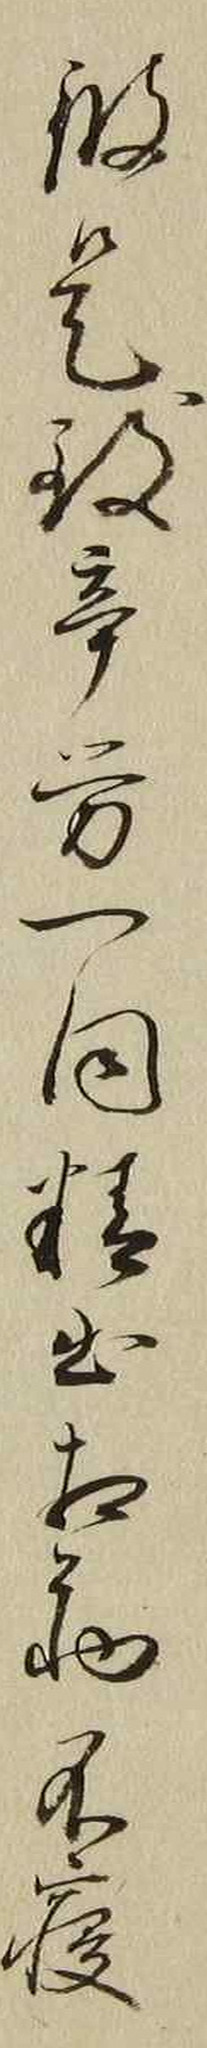彼是致辛労一同精出相勤不寝
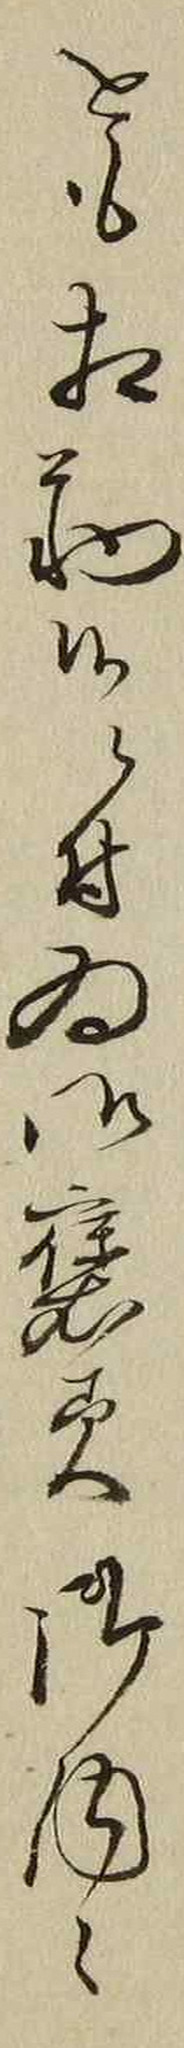をも相勤候に付為御褒美御内々
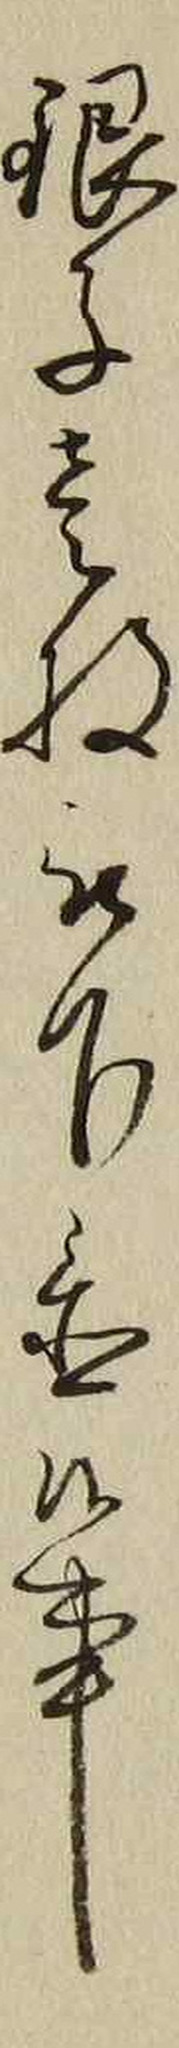銀子壱枚被下置候事
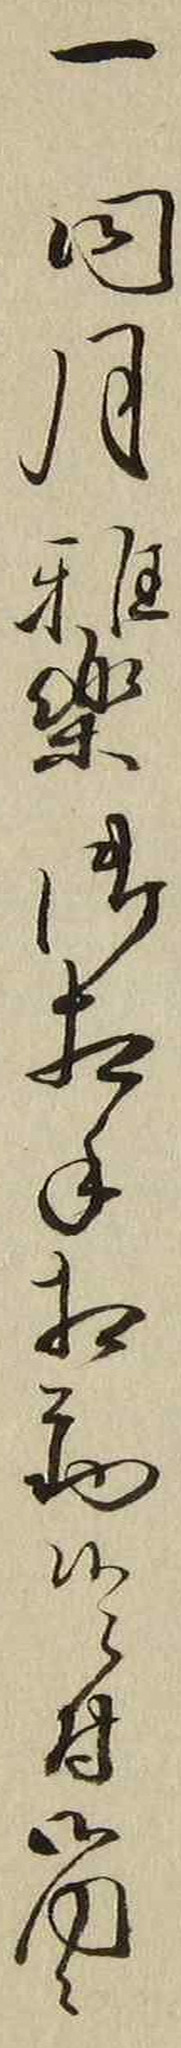一同月雅楽御相手相勤候に付御内々
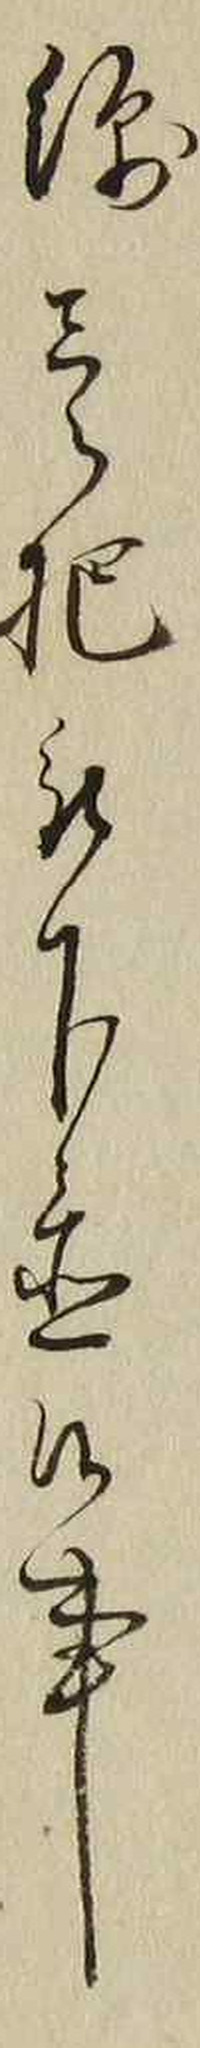綿壱把被下置候事
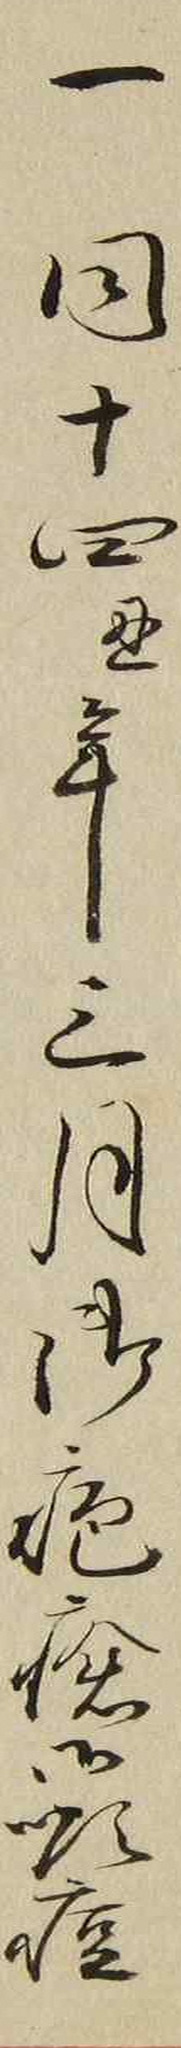一同十四丑年三月御疱瘡御順痘
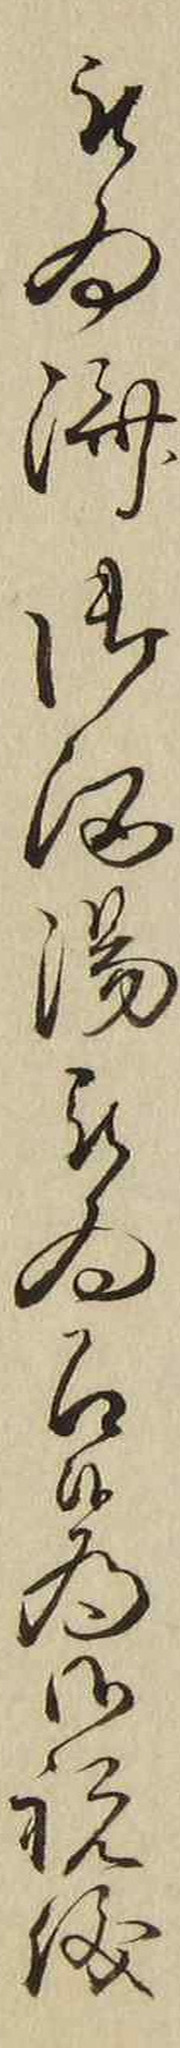被為済御酒湯被為召候為御祝儀

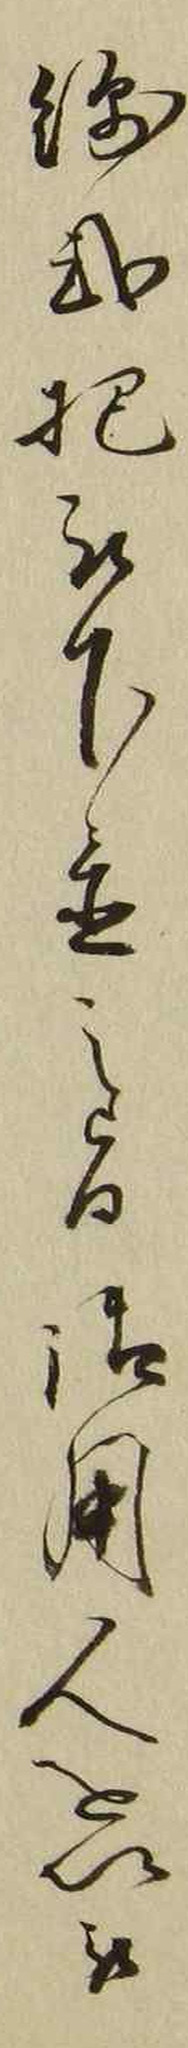綿弐把被下置の旨御用人を以被
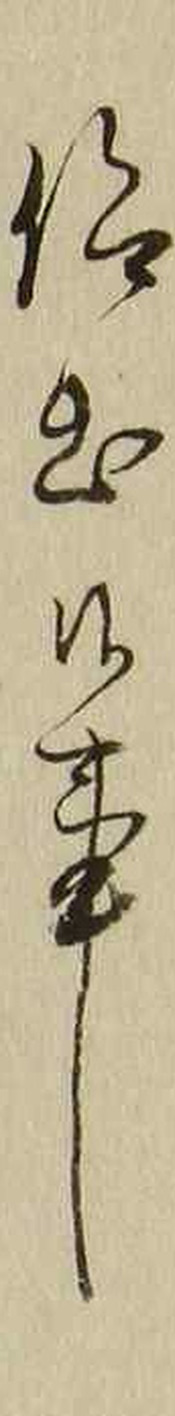仰出候事
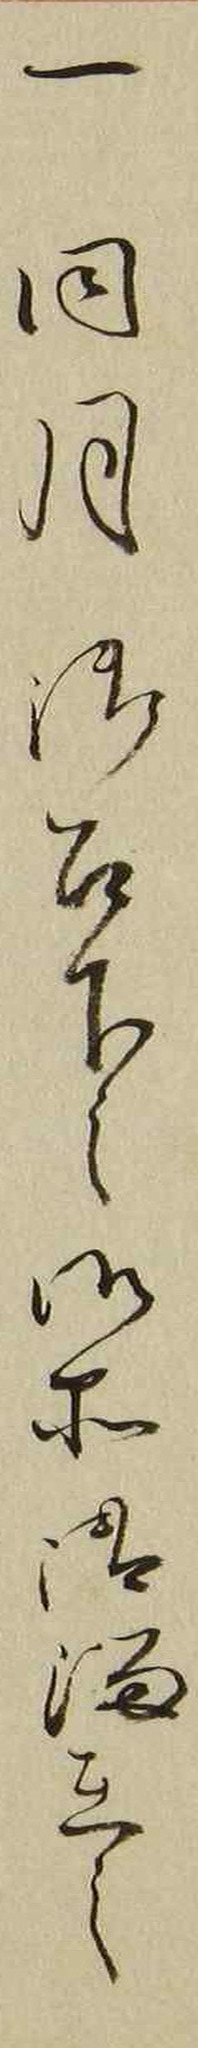一同月御召下の御品御溜在之
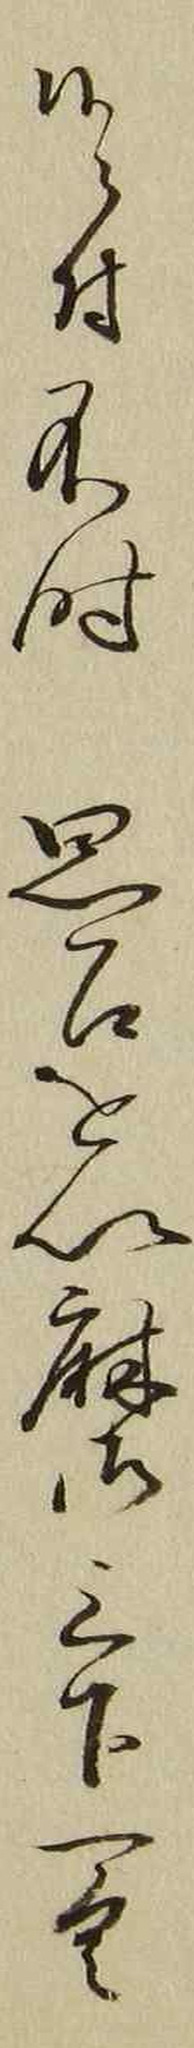候に付不時思召を以麻御上下一具
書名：諸士系譜　巻之1　い之部1
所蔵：会津若松市立会津図書館
